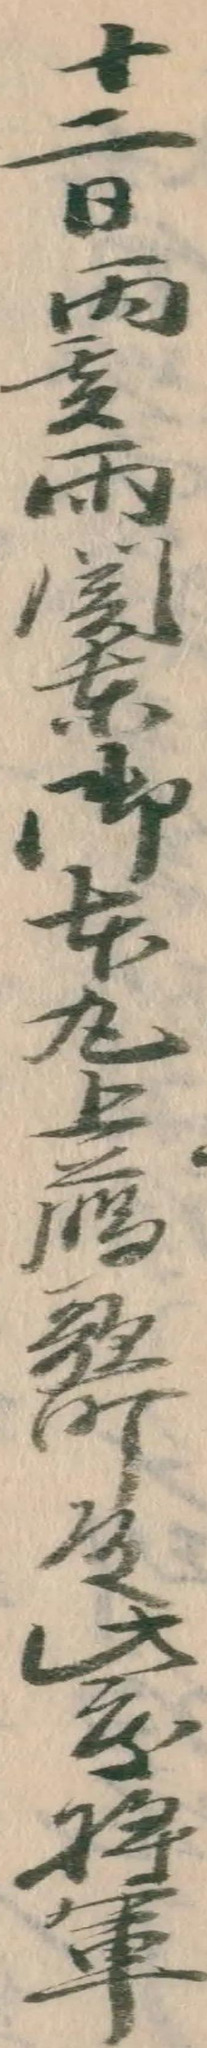十二日丙亥雨関東御本丸上上臈歌町殿此度将軍
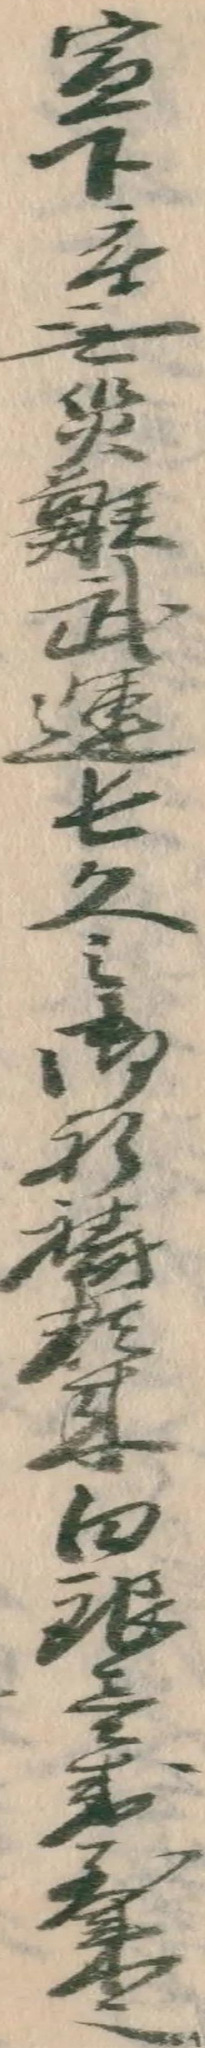宣下ニ付無災難武連長久之御折職頼来白銀壱歩到来也
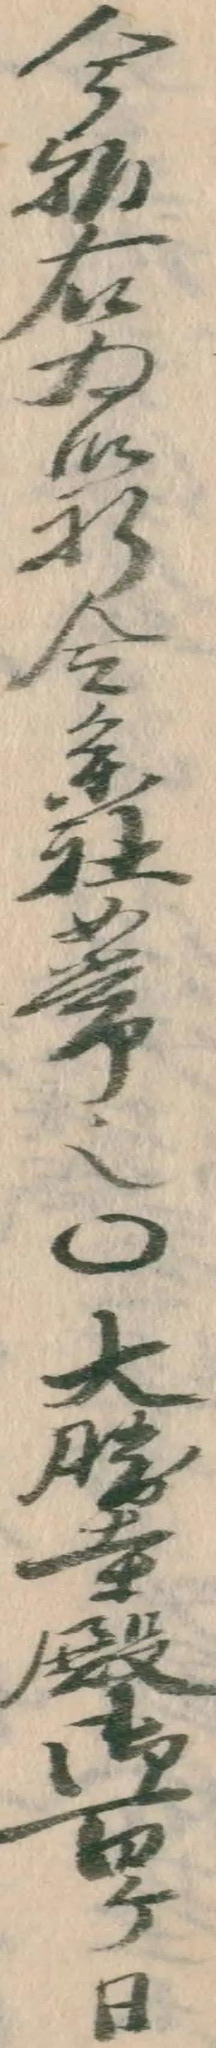今朝右為御祈令参社如常也○大勝寺殿御百ヶ日
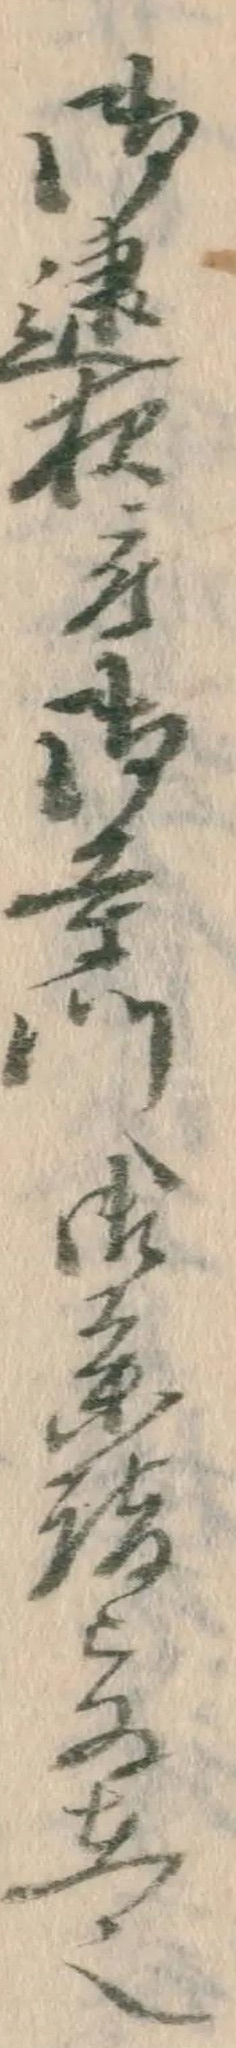御逮夜ニ付御寺門へ御参詣被為在也
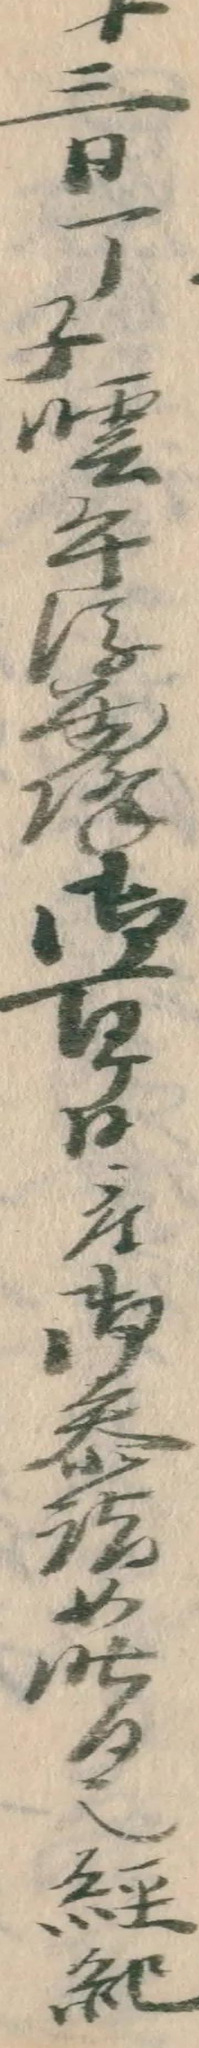十三日丁子曇午後両降御百ケ日ニ付御参詣如昨日也経紀
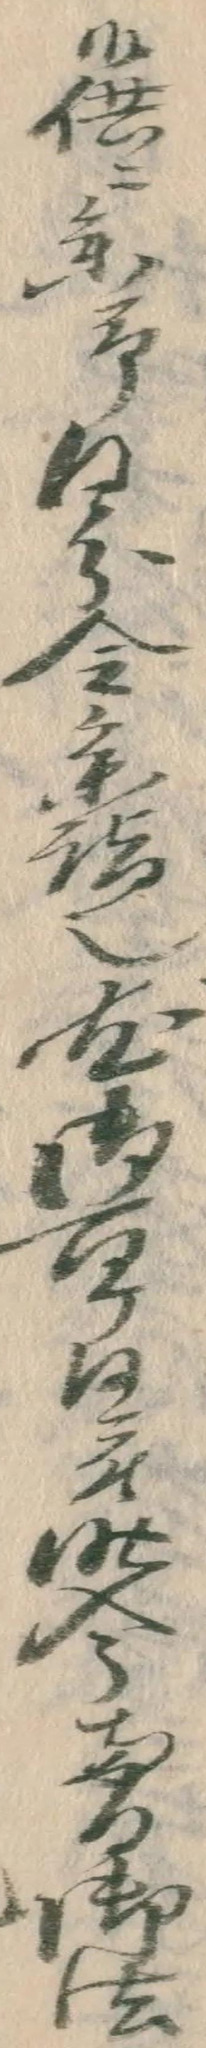御供二参予自分会参詣也尤御百ヶ日二付昨今両日御法
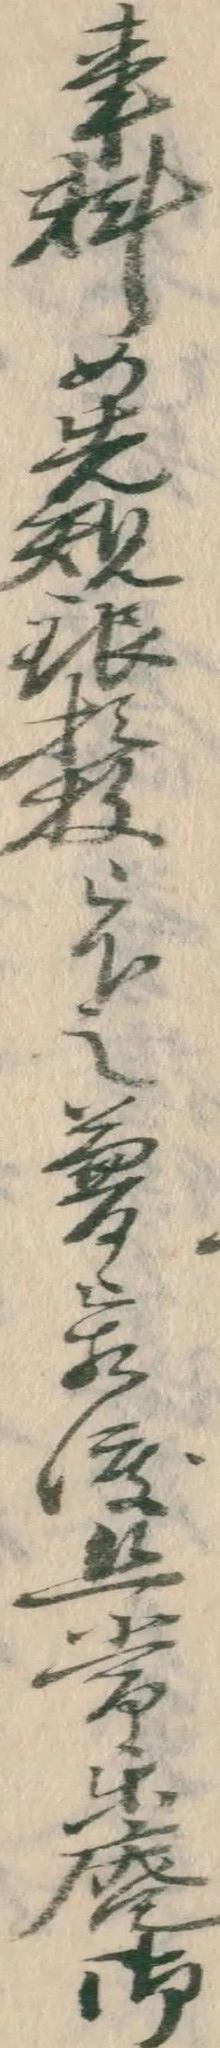事料如先規銀拾枚被下也兼而被相渡且常楽庵御
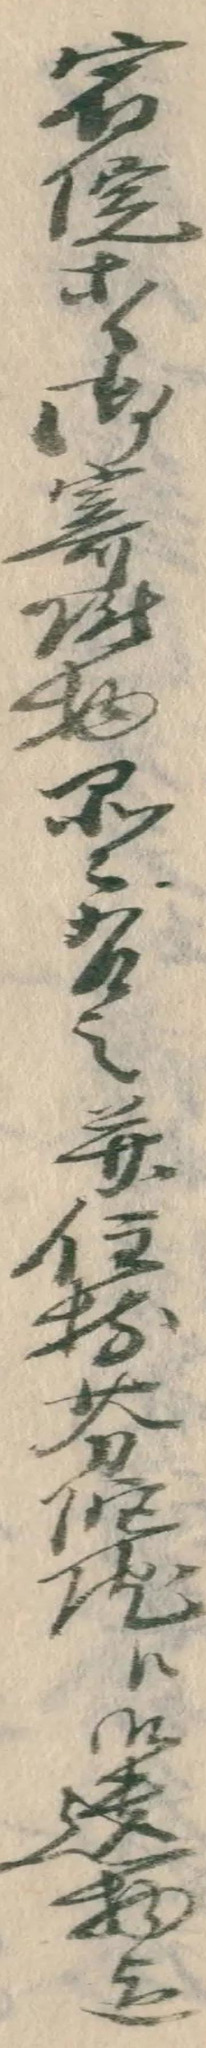宿院等へ御寄附物品々有之幷住持芬陀院ハ御遺物迄
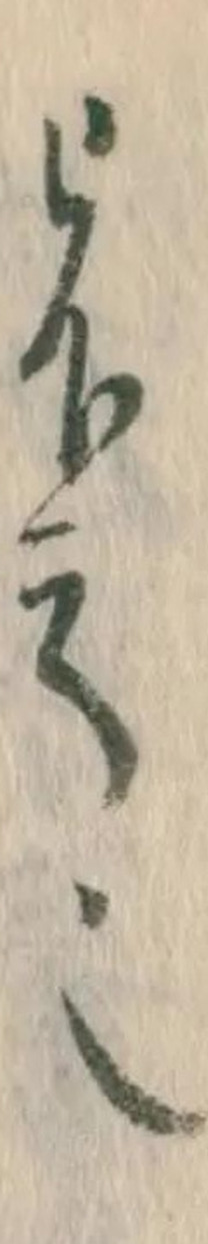被下之也
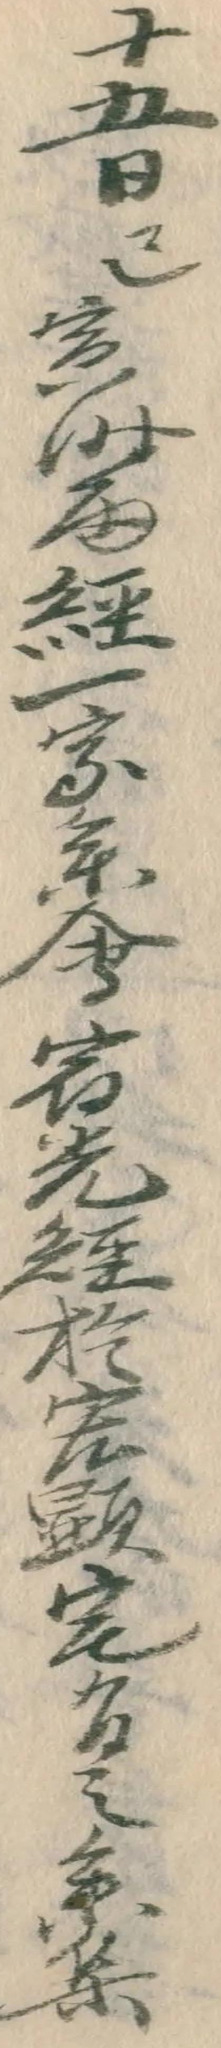十五日己寅時雨経一家参會宿光経於宏顕宅有之参集
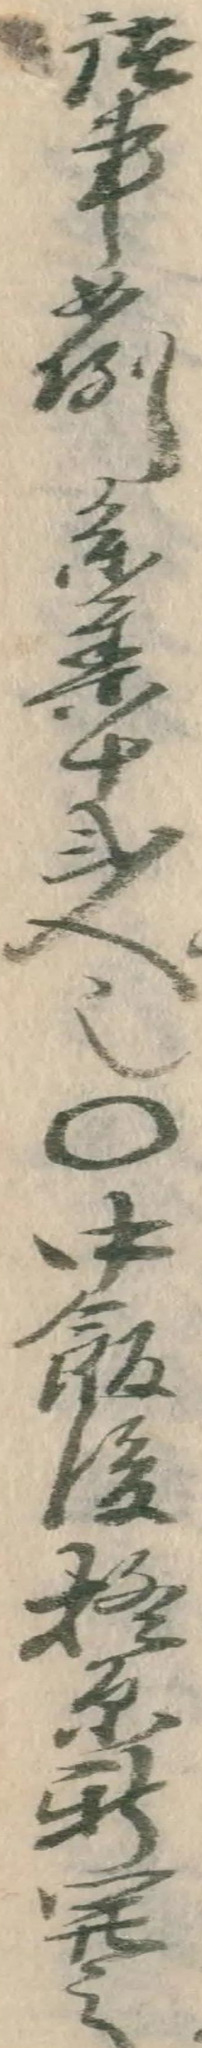諸事如例参集十弐人也○中飯後柊原新開之

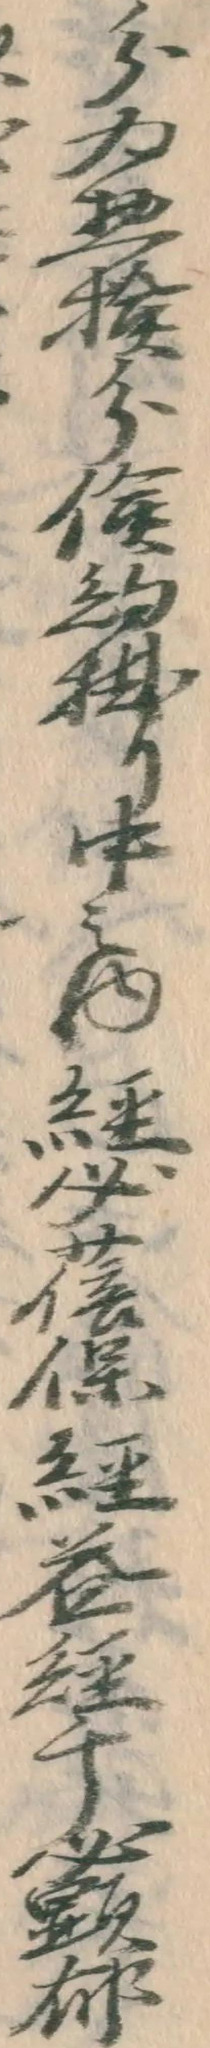分為惣検分倹約掛り中之内経必蓓保経益経千必顕郁
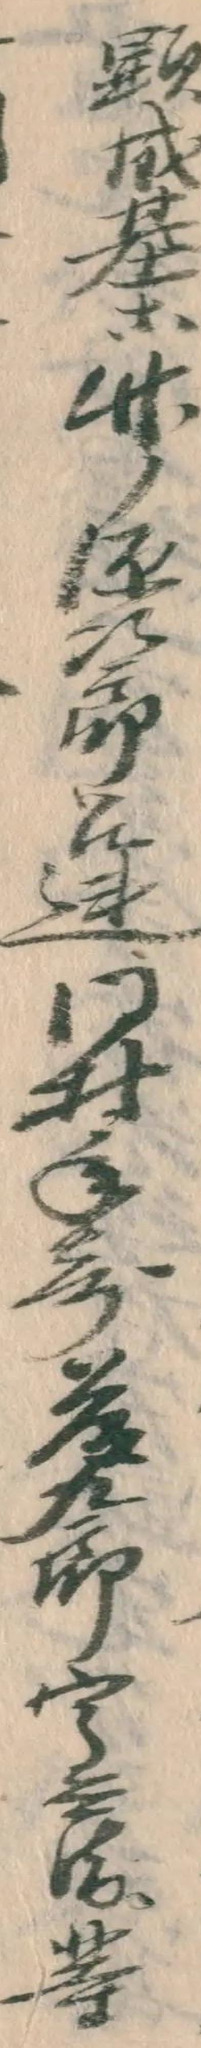顕成基等竹ノ源次郎召連同村年寄藤九郎宇兵衛等
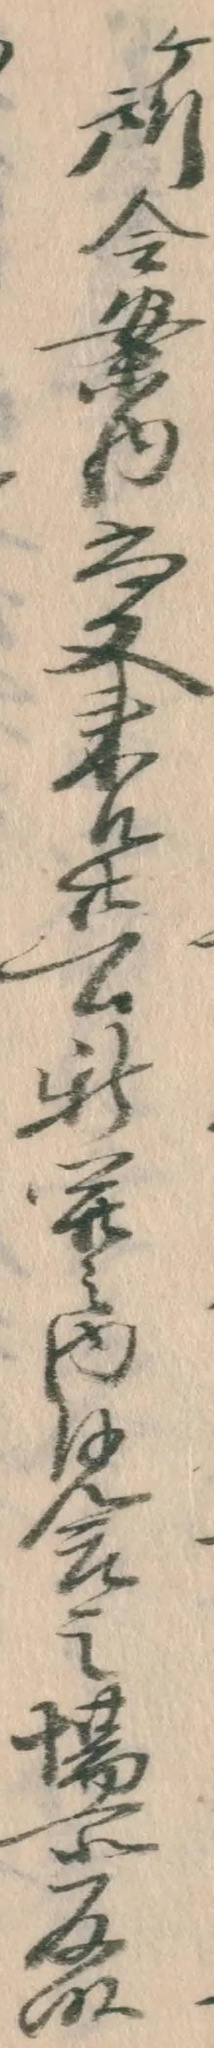ケ所令案内尚又来ル廿一日新開之内見合之場所反畝
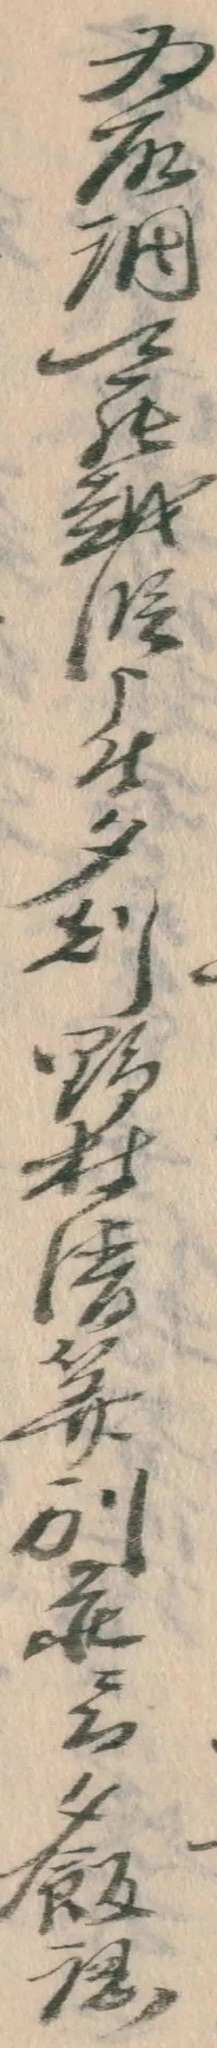為取調可罷越段申付タリ野村清算別条ニ而夕飯認
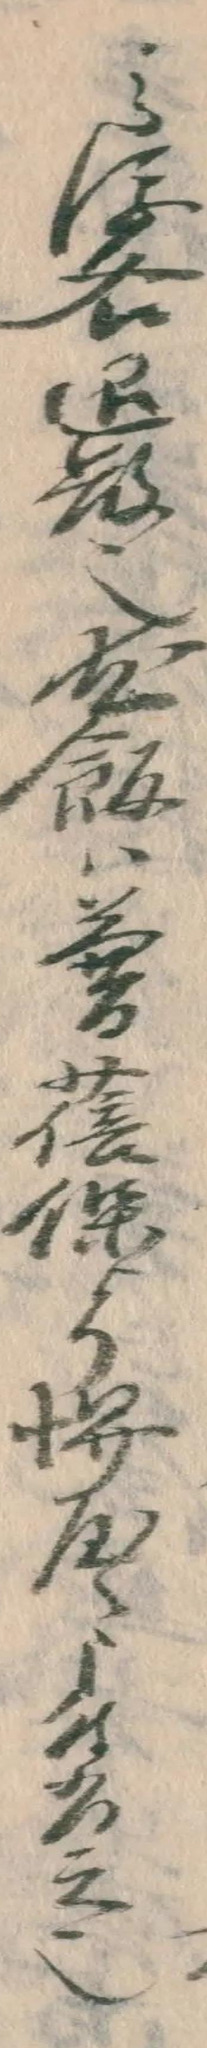之後各退散也尤飯ハ兼日蓓保より堺屋へ申付有之也
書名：賀茂社記録. 第67冊
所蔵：国立国会図書館 National Diet Library, JAPAN
